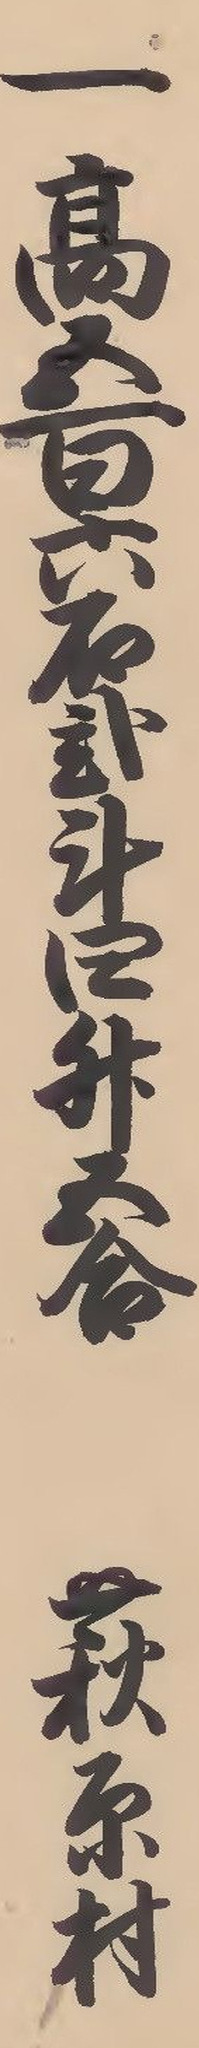一高五百六石弐斗四升五合萩原村
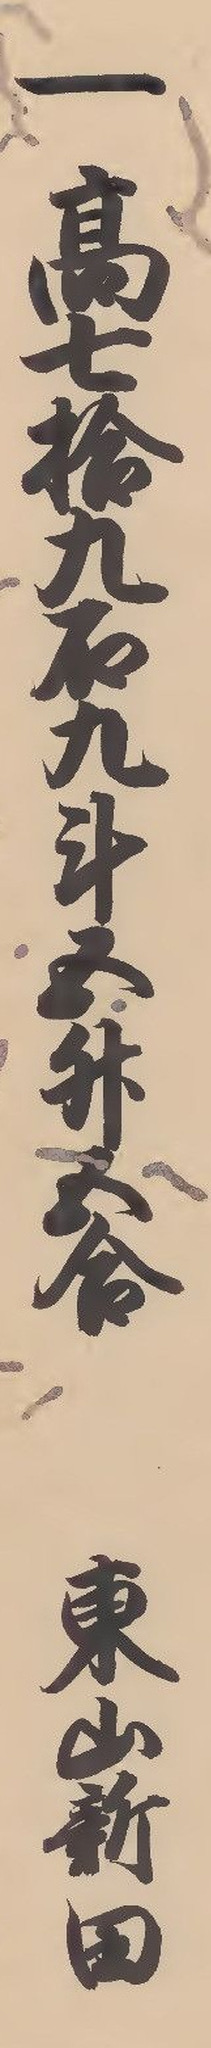一高七拾九石九斗五升五合東山新田

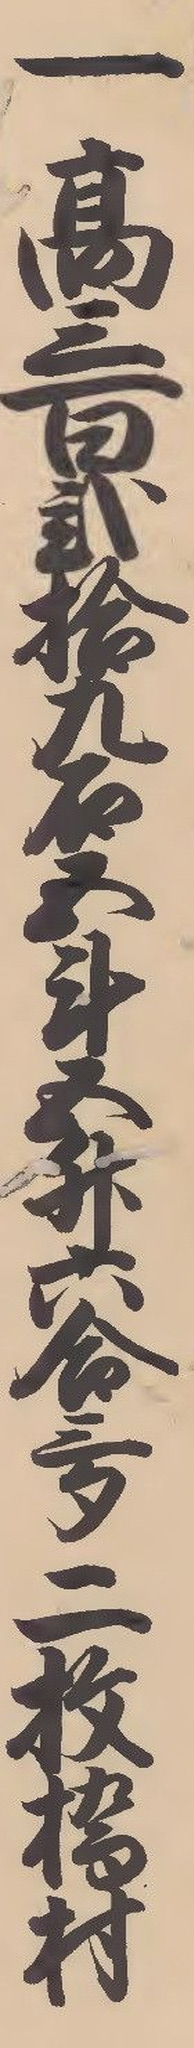一高三百弐拾九石五斗五升六合三勺二枚橋村
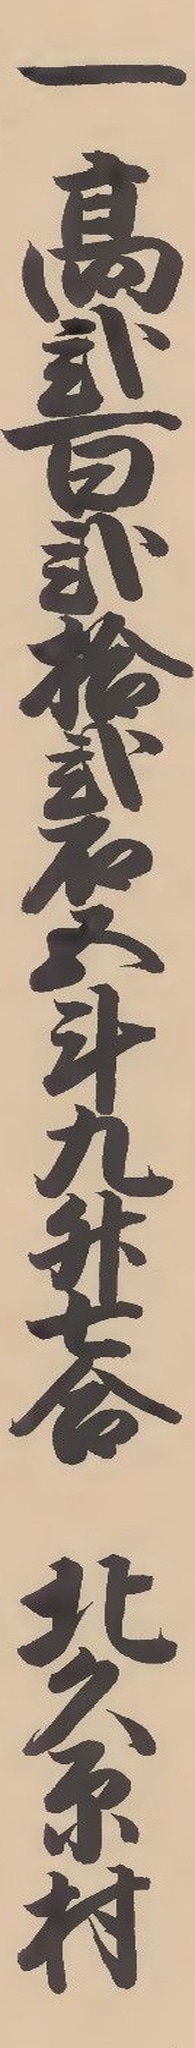一高弐百弐拾弐石五斗九升七合北久原村
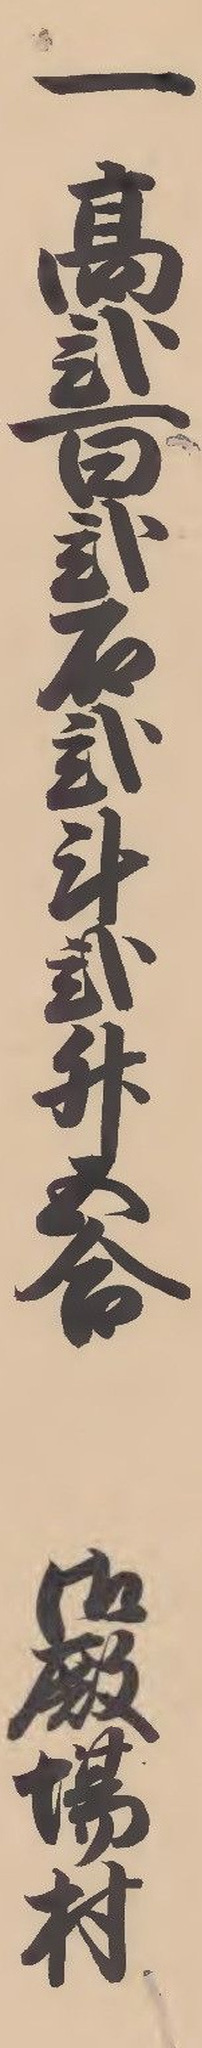一高弐百弐石弐斗弐升五合御殿場村
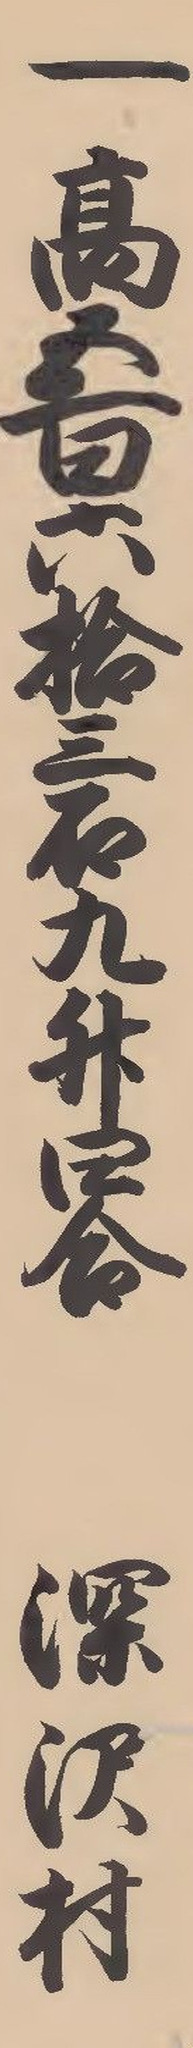一高五百六拾三石九升四合深沢村
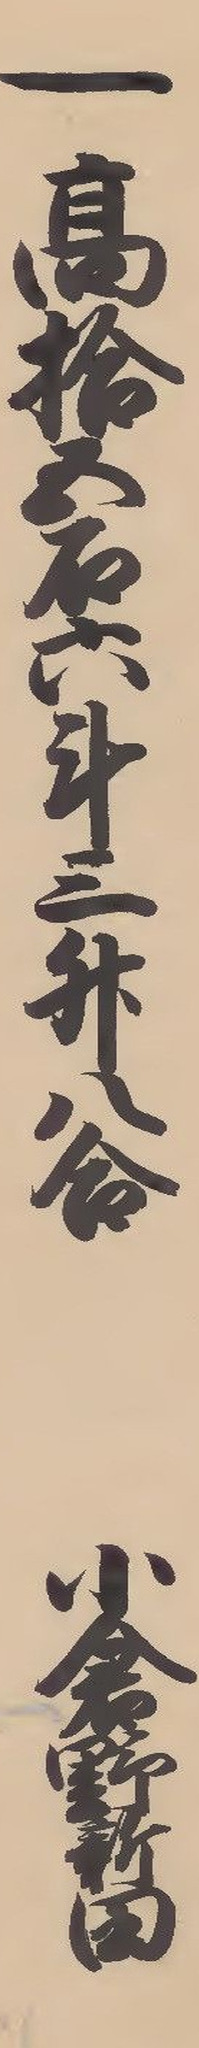一高拾五石六斗三升八合小倉野新田
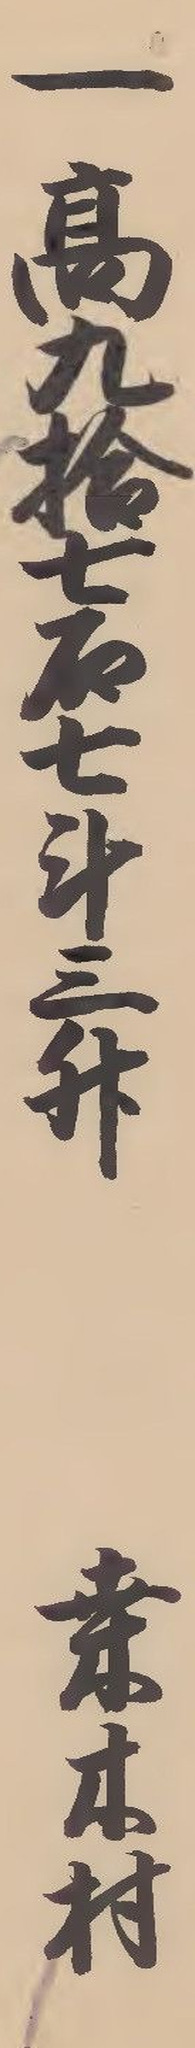一高九拾七石七斗三升桑木村
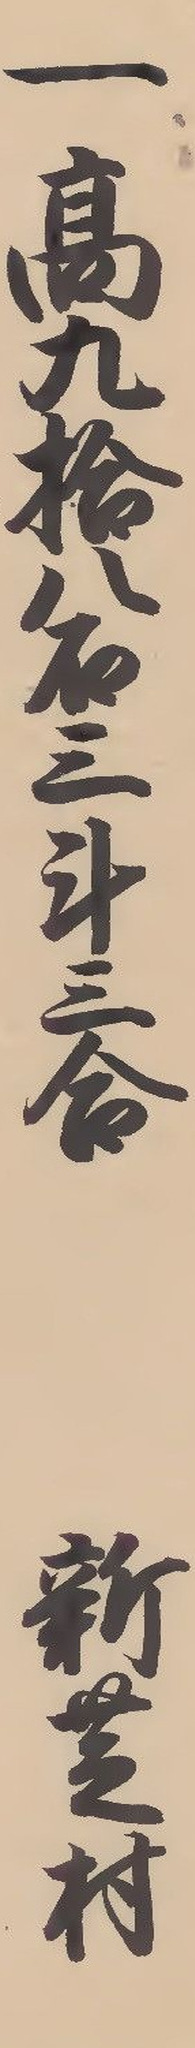一高九拾八石三斗三合新芝村
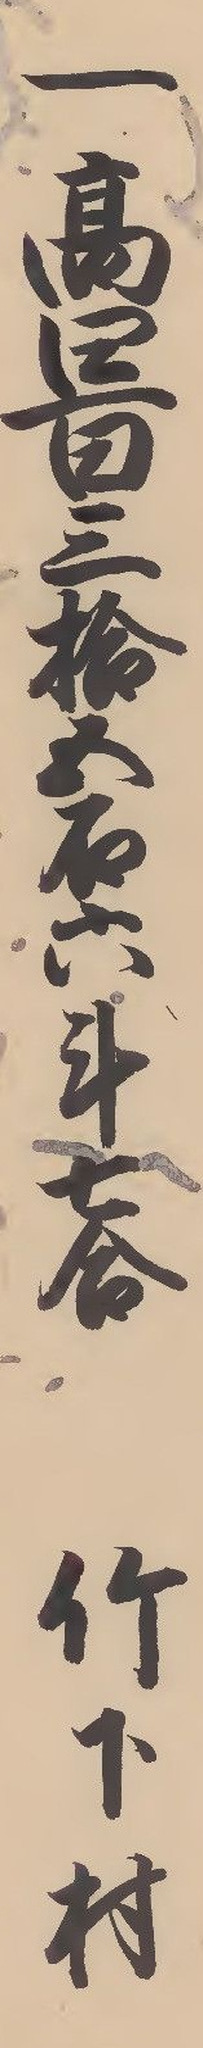一高四百三拾五石六斗七合竹下村

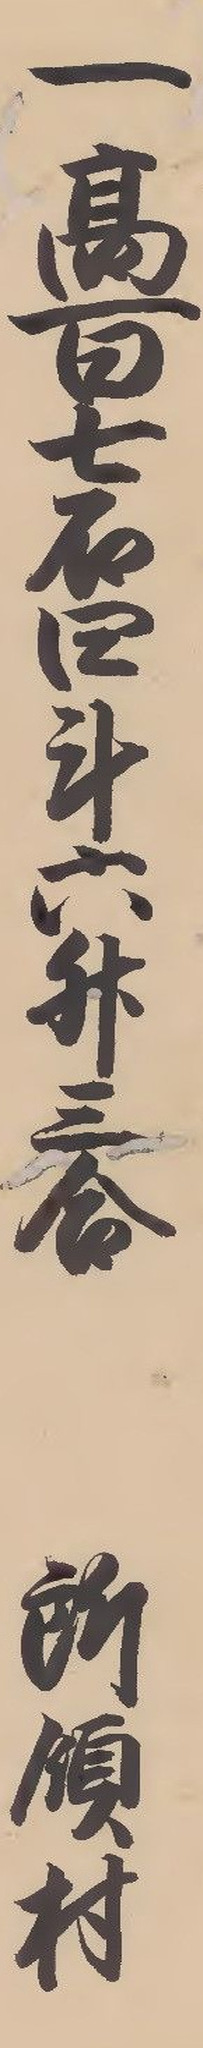一高百七石四斗六升三合所領村
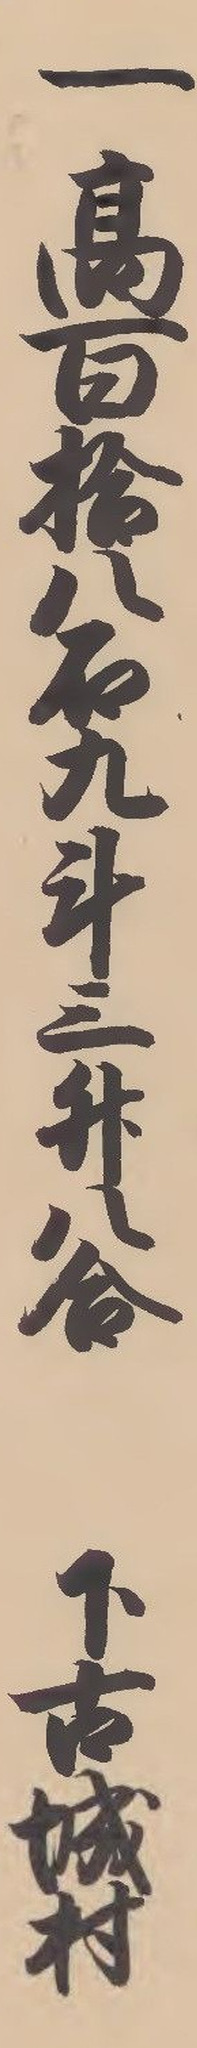一高百拾八石九斗三升八合下古城村
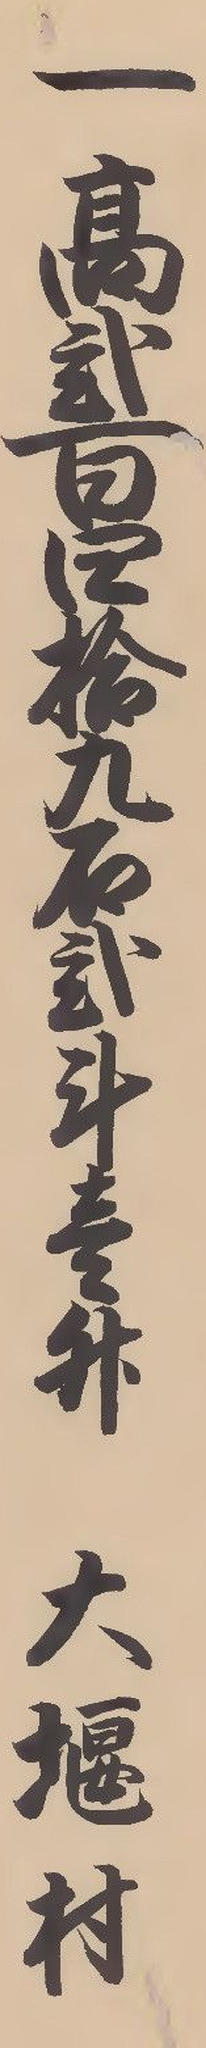一高弐百四拾九石弐斗壱升大堰村
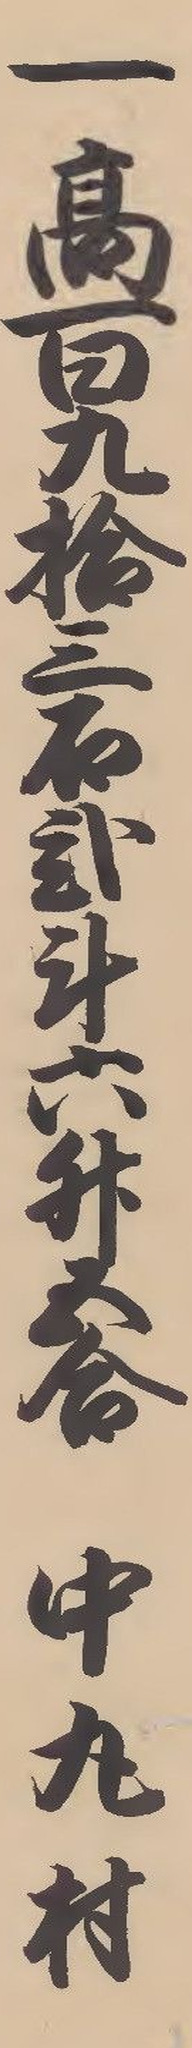一高百九拾三石弐斗六升五合中丸村
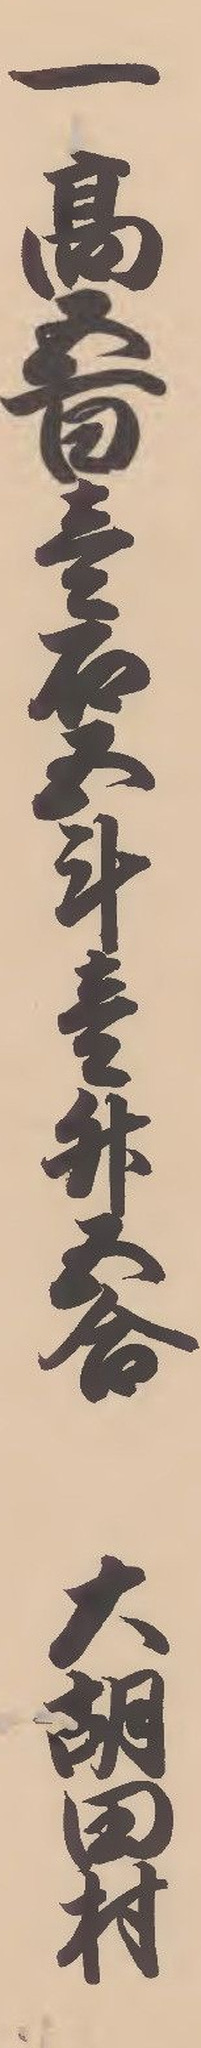一高五百壱石五斗壱升五合大胡田村
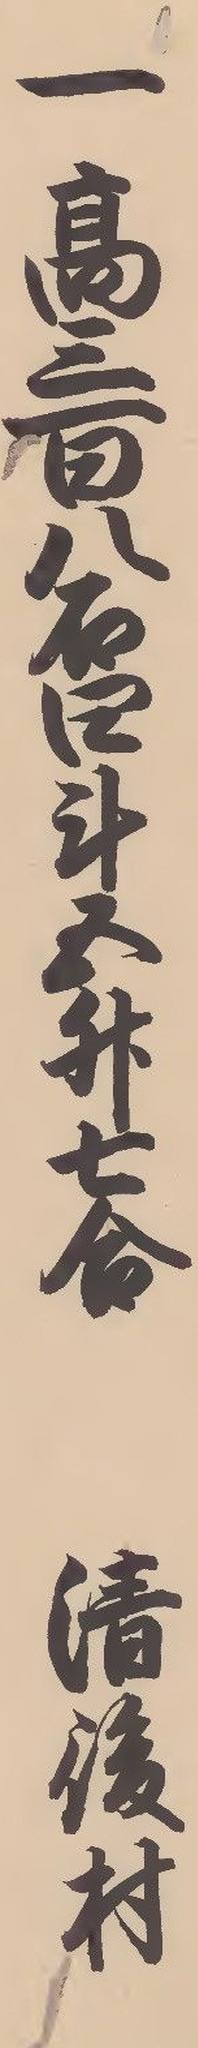一高三百八石四斗五升七合清後村
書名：駿河国郷帳
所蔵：国立公文書館 National Archives of Japan
